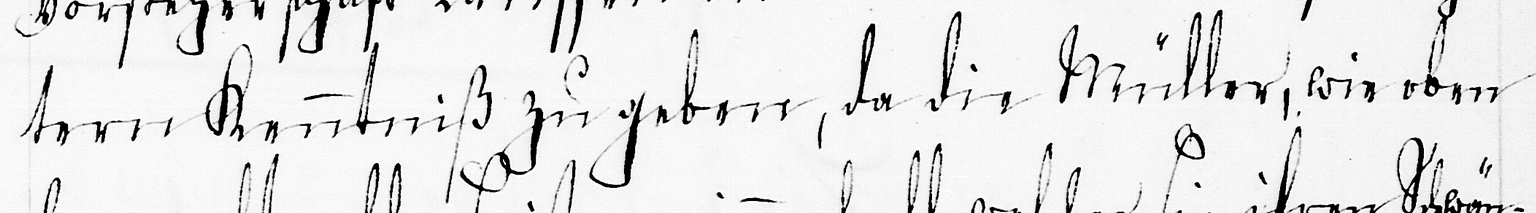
ztern Kenntniß zu geben, da die Müller, wie oben
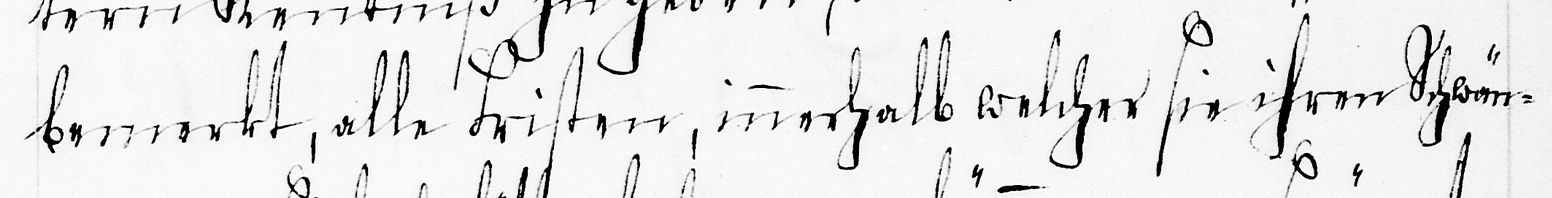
bemerkt, alle Fristen, innerhalb welcher sie ihren Schwä¬
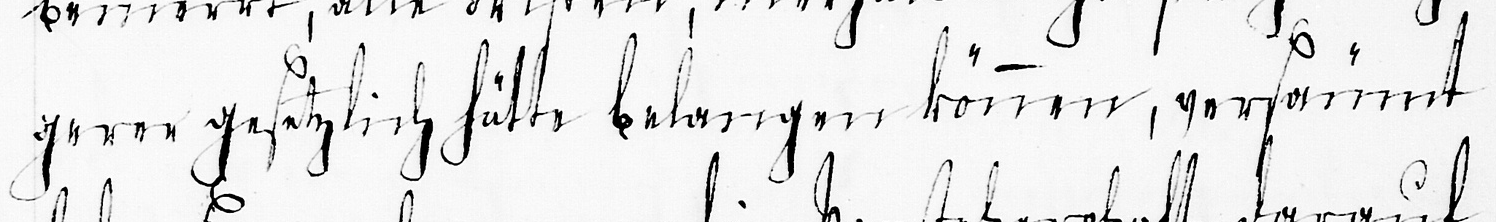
ngerer gesetzlich hätte belangen können, versäumt
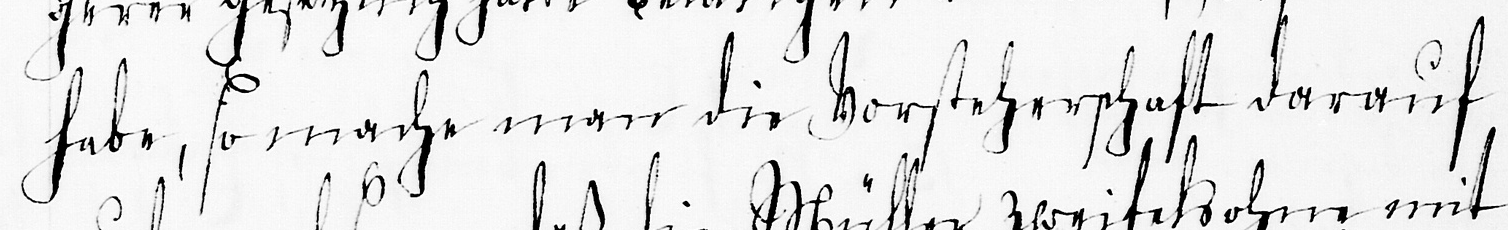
habe, so mache man die Vorsteherschaft darauf
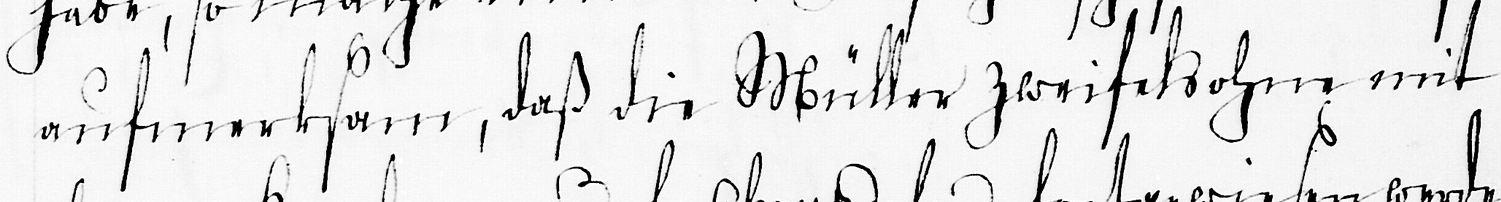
aufmerksam, daß die Müller zweifelsohne mit
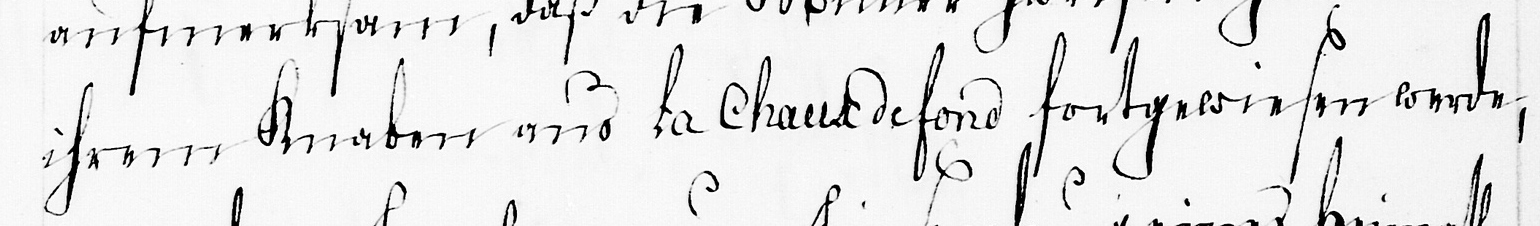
ihrem Knaben aus La Chaux de fond fortgewiesen werde,
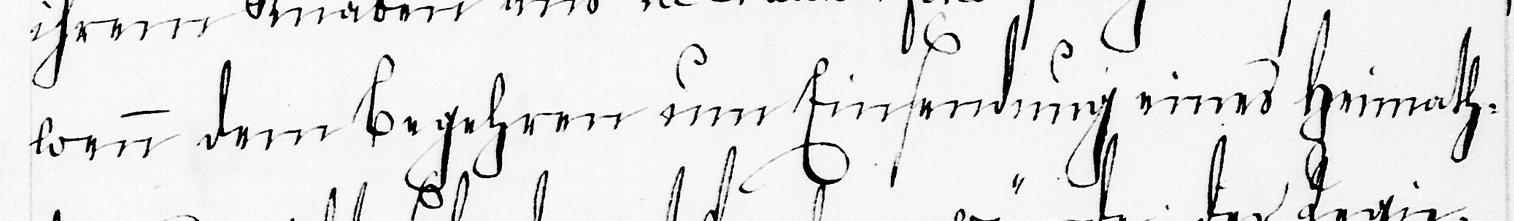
wenn dem Begehren um Einsendung eines Heimath¬
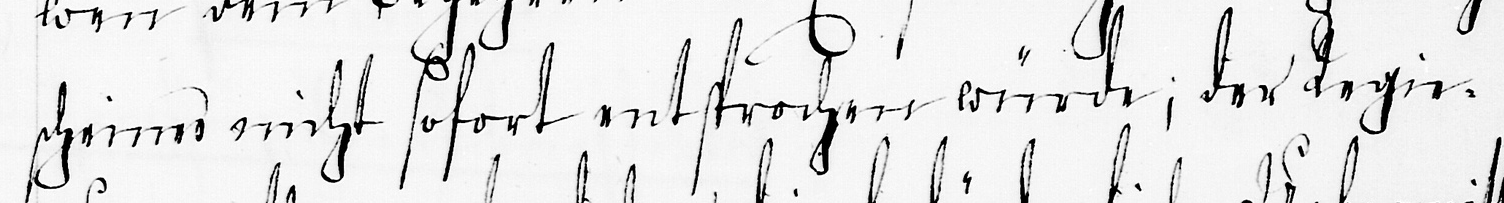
scheines nicht sofort entsprochen würde; der Regie¬
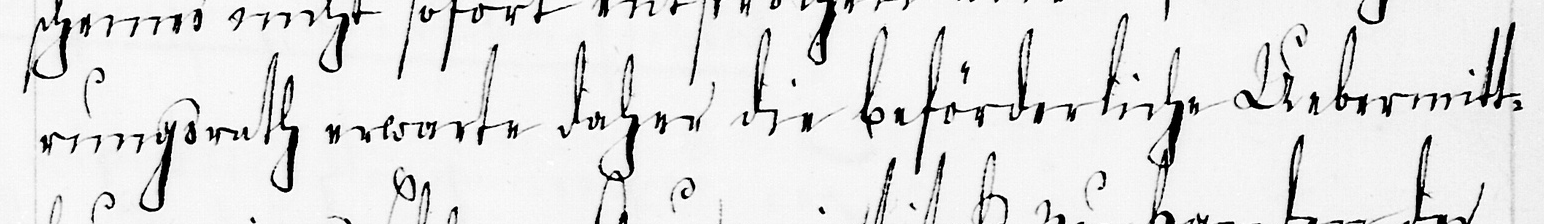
rungsrath erwarte daher die beförderliche Uebermitt¬
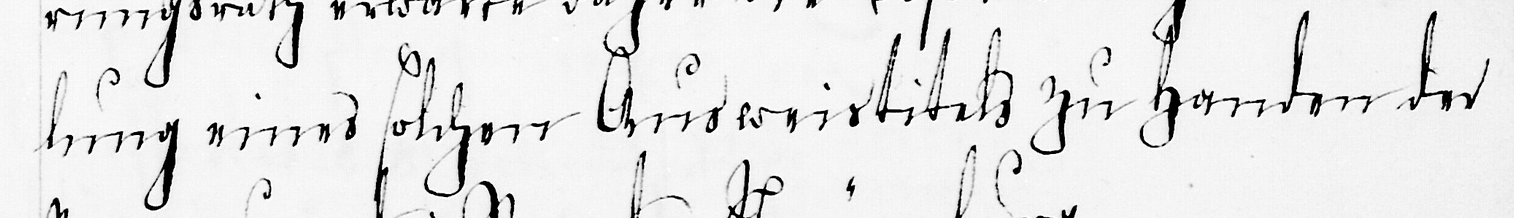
lung eines solchen Ausweistitels zu Handen der
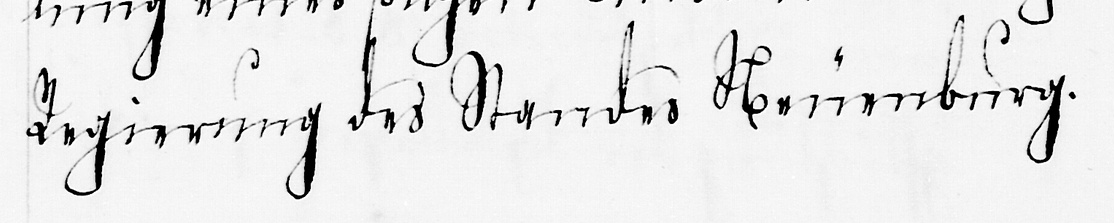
Regierung des Standes Neuenburg.
